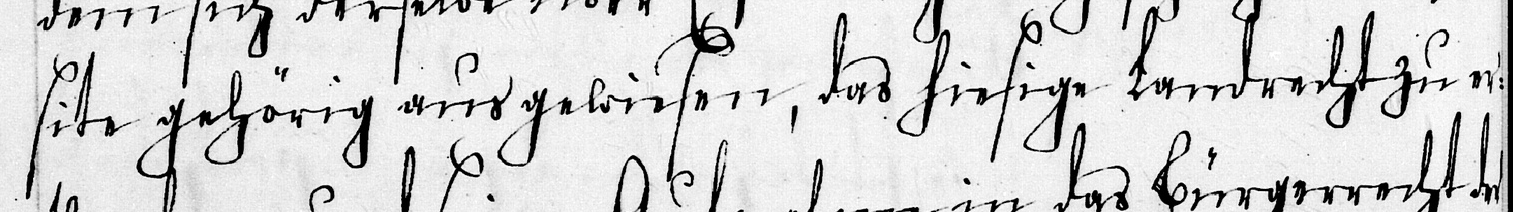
isite gehörig ausgewiesen, das hiesige Landrecht zu e¬
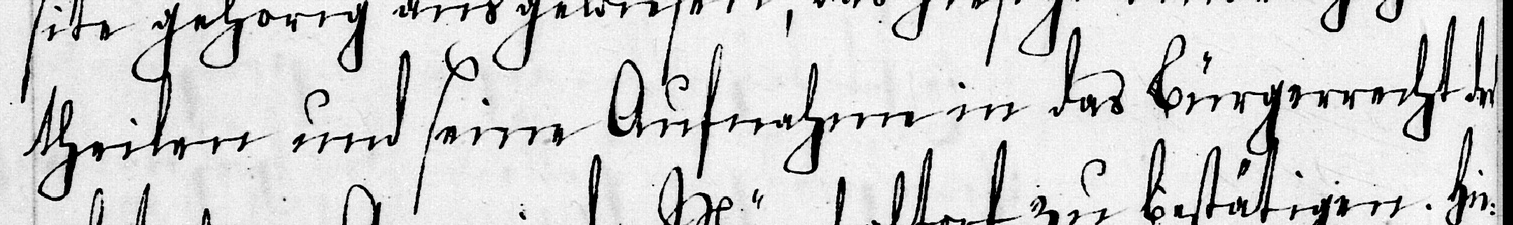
rtheilen und seine Aufnahme in das Bürgerrecht d¬
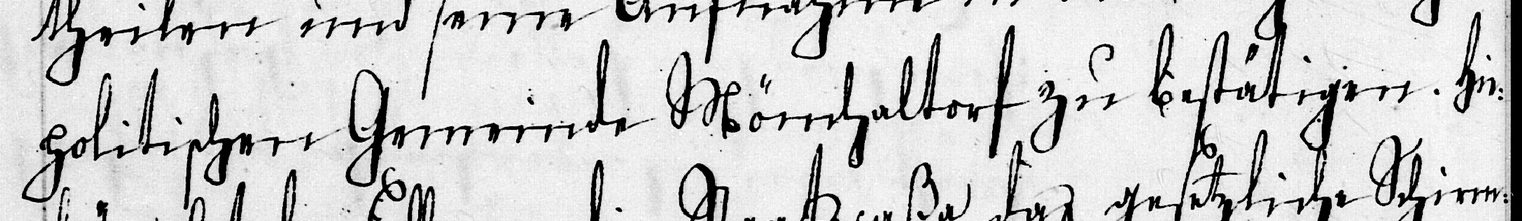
politischen Gemeinde Mönchaltorf zu bestätigen. Hie¬
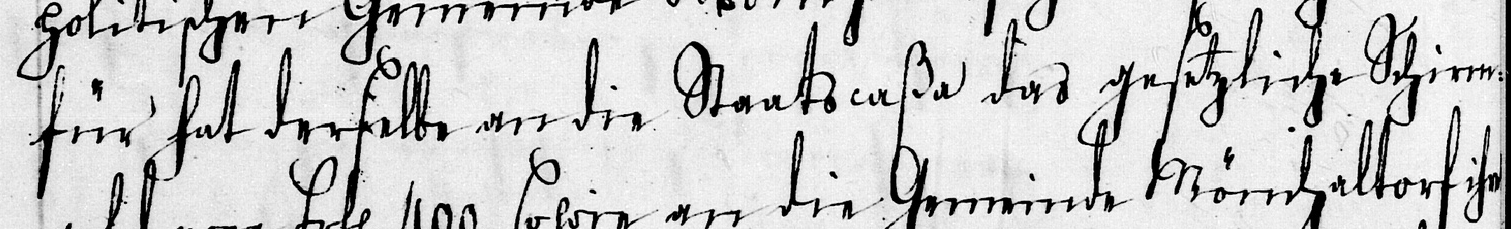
für hat derselbe an die Staatscaßa das gesetzliche Schir¬
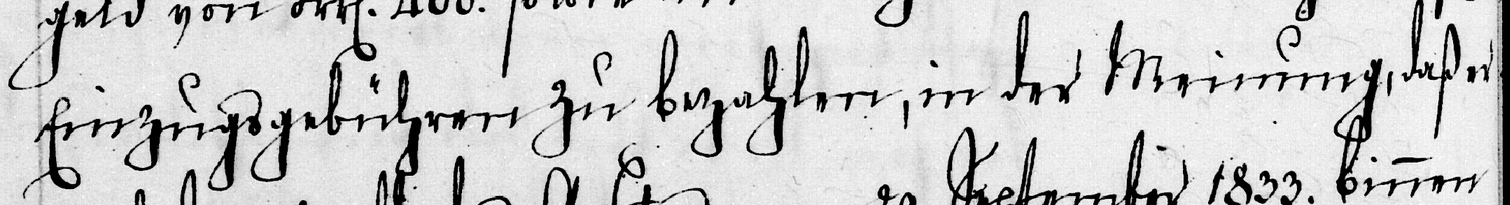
Einzugsgebühren zu bezahlen, in der Meinung, daß er
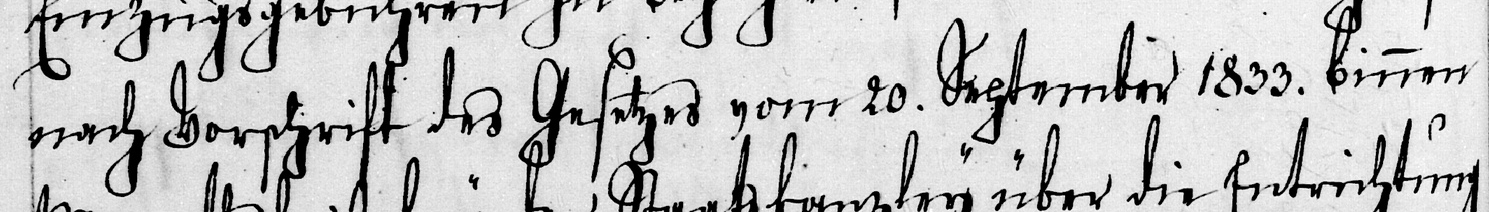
nach Vorschrift des Gesetzes vom 20. September 1833. binnen
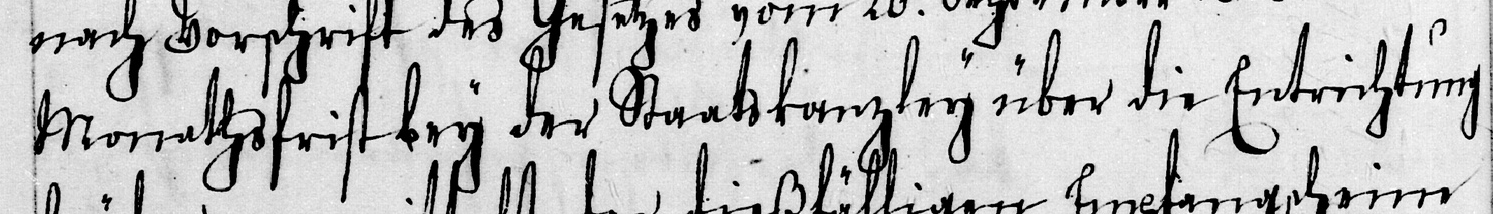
Monathsfrist bey der Staatskanzley über die Entrichtung
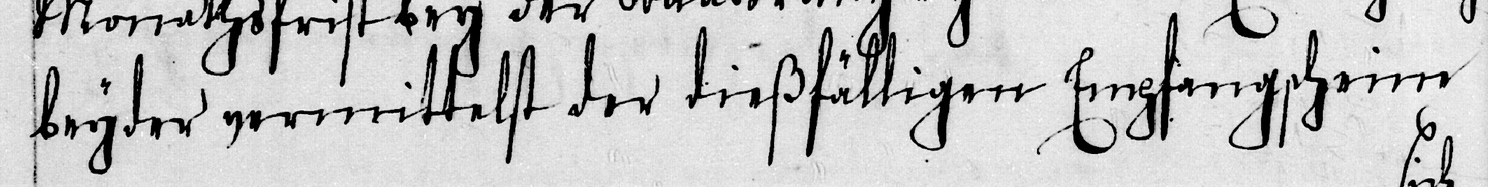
beyder vermittelst der dießfälligen Empfangscheine
